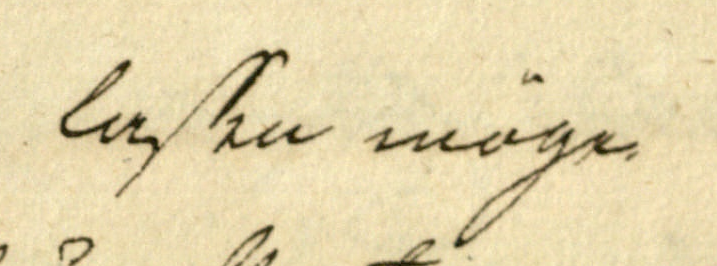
lassen möge.
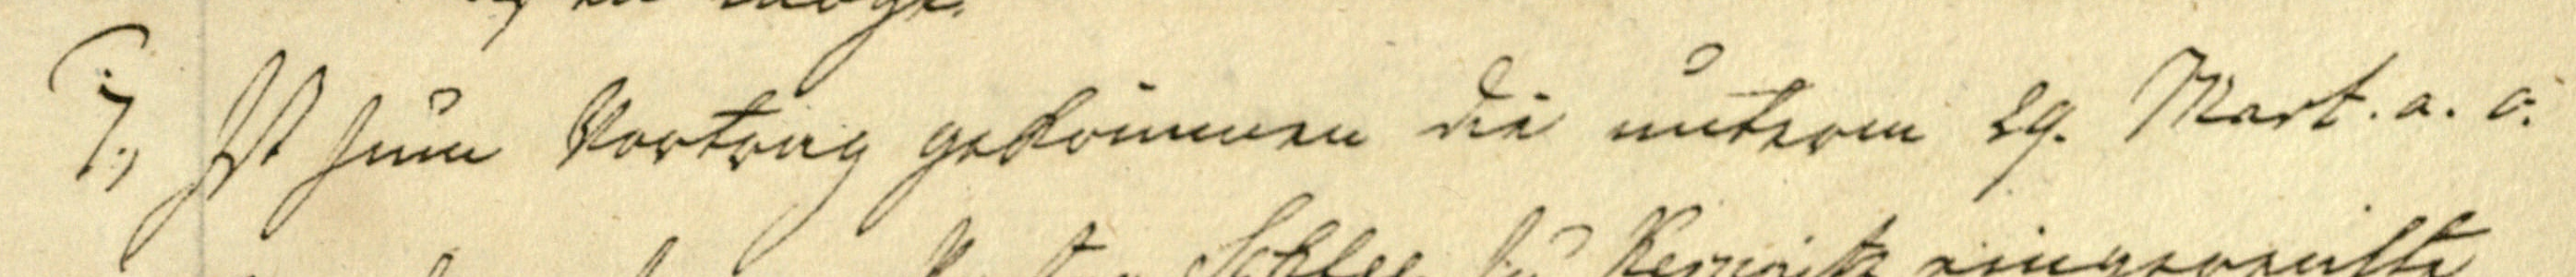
7. Ist zum Vortrag gekommen die unterm 29. Mart. a. c.
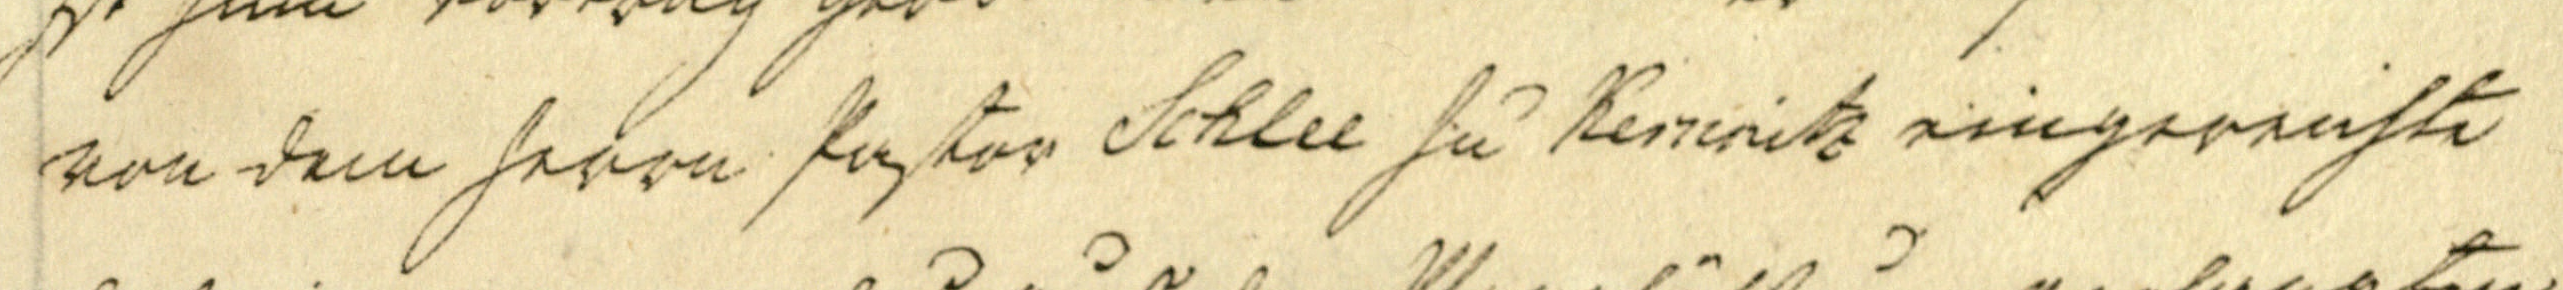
von dem Herrn Pastor Schlee zu Kemnitz eingereichte
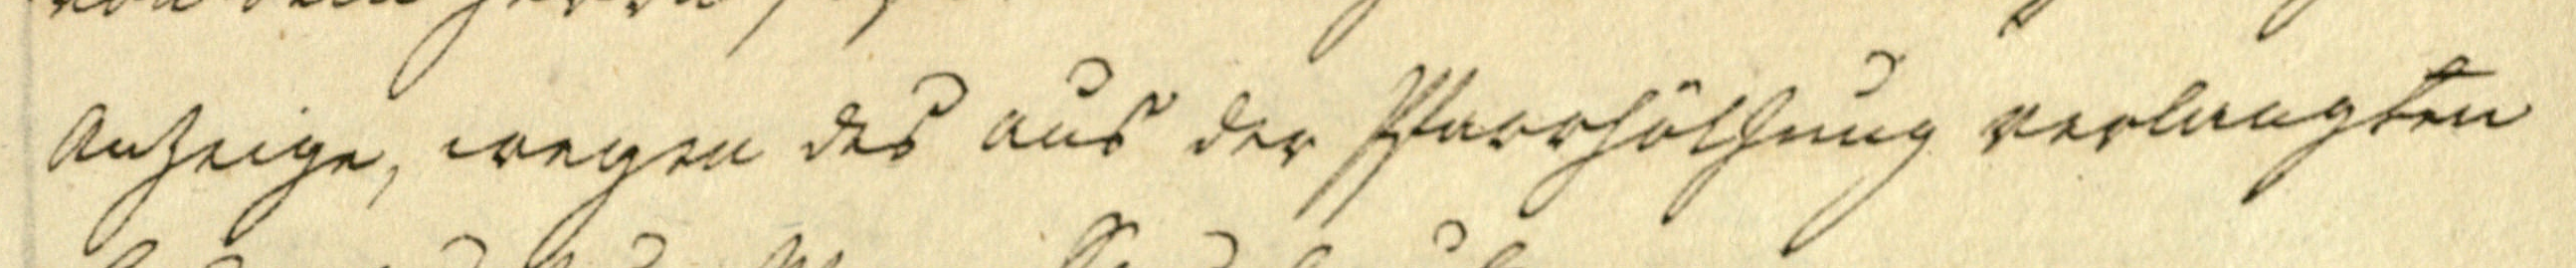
Anzeige, wegen des aus der Pfarrhölzung verlangten
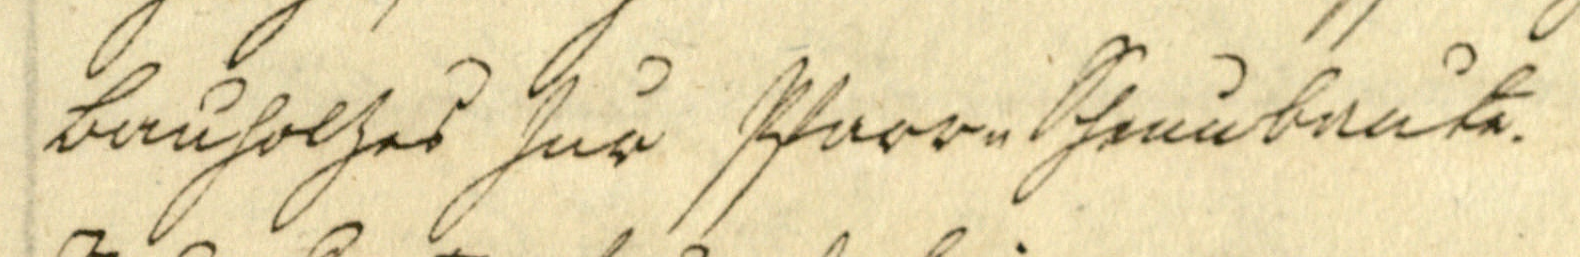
Bauholzes zur Pfarr-Scheunbaute.
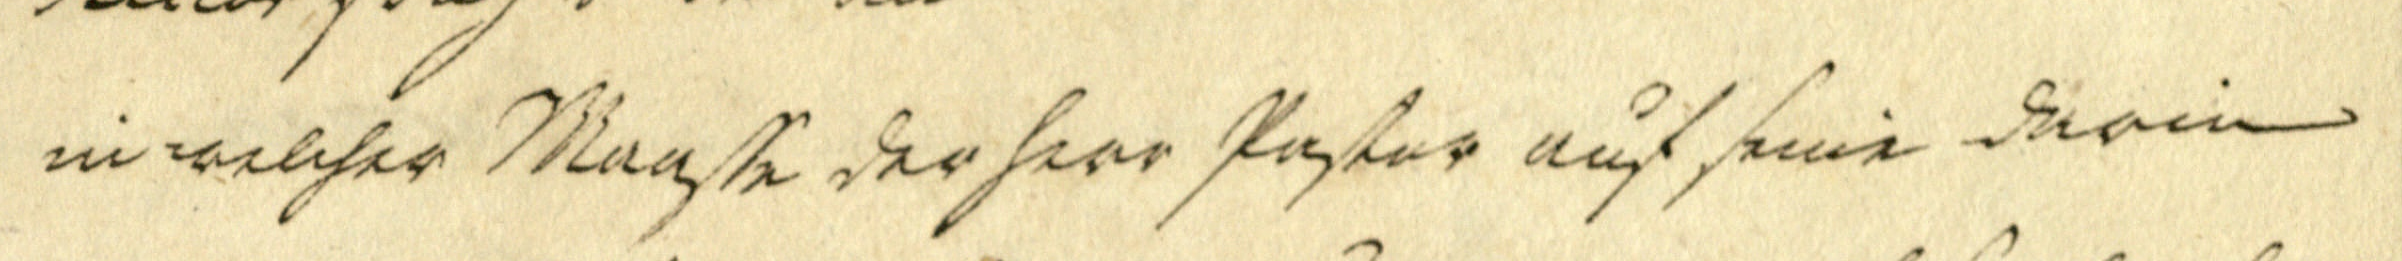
in welcher Maasse der Herr Pastor auf seine darin
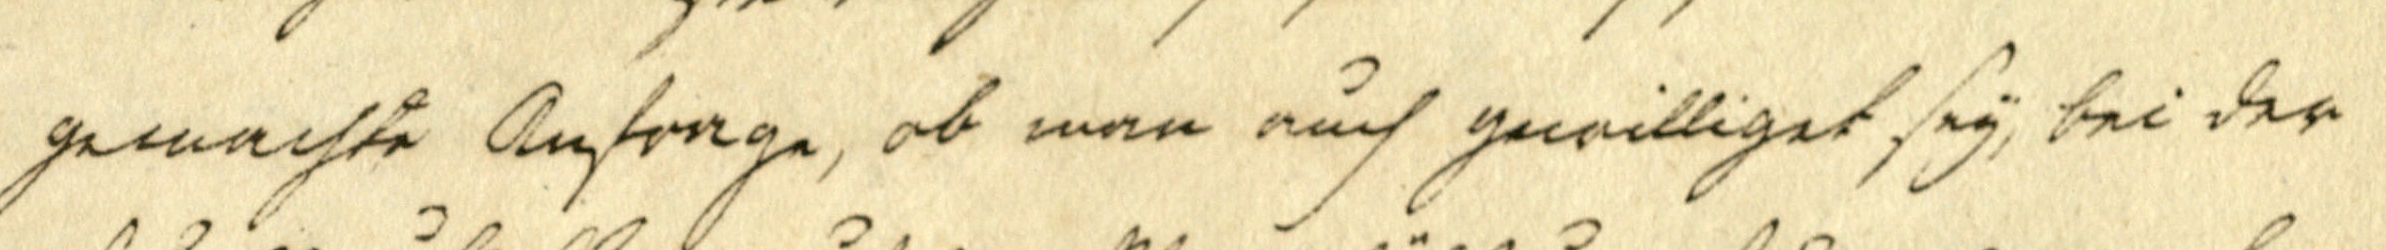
gemachte Anfrage, ob man auch gewilliget seÿ, bei der
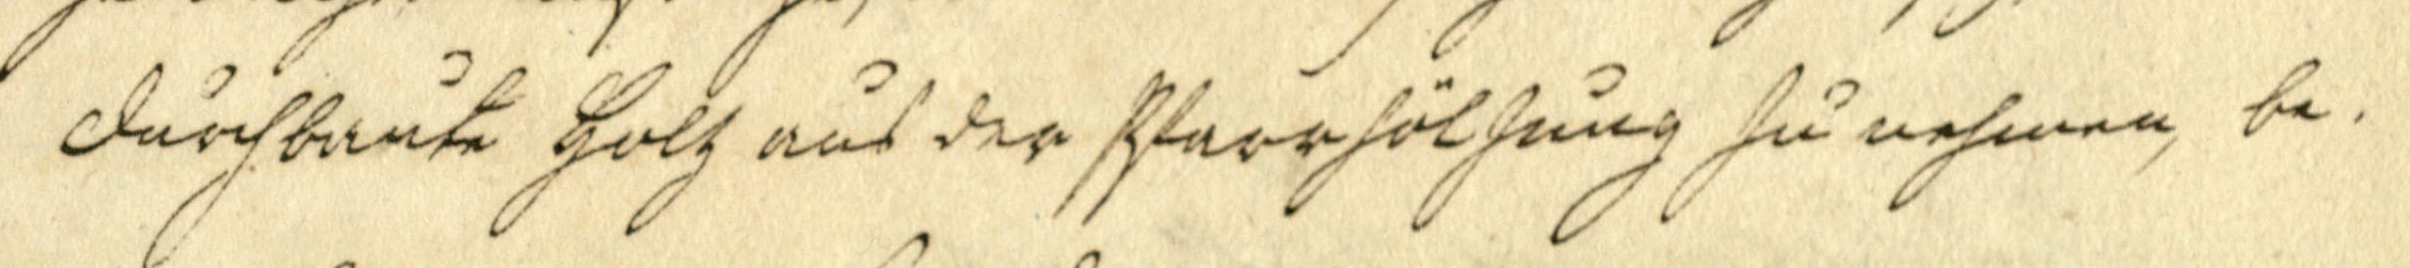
Durchbaute Holz aus der Pfarrhölzung zu nehmen, be¬
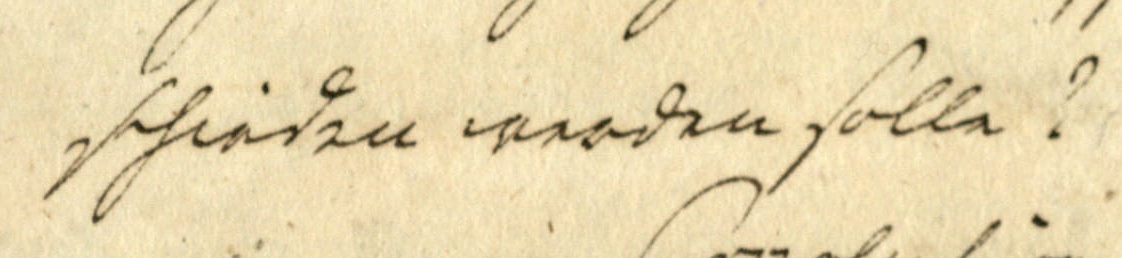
schieden werden solle?
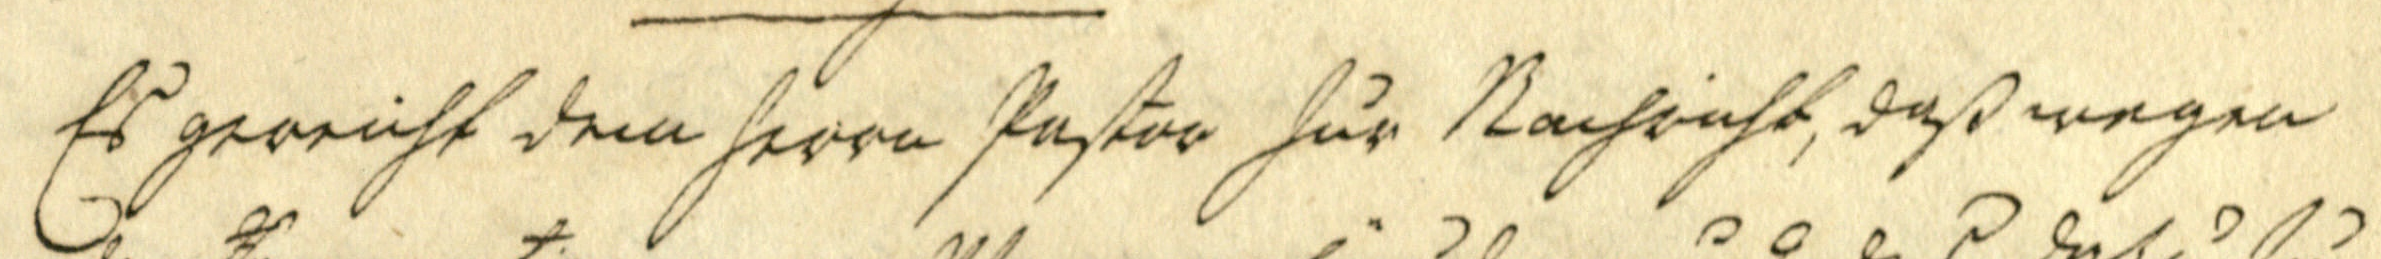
Es gereicht dem Herrn Pastor zur Nachricht, daß wegen
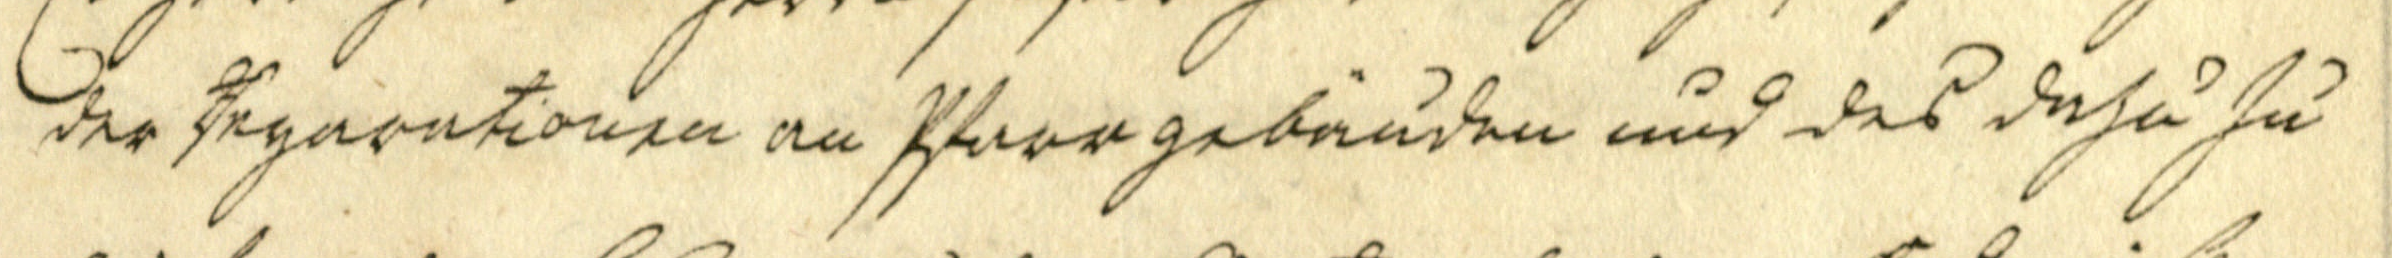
der Reparationen an Pfarr gebäuden und des dazu zu
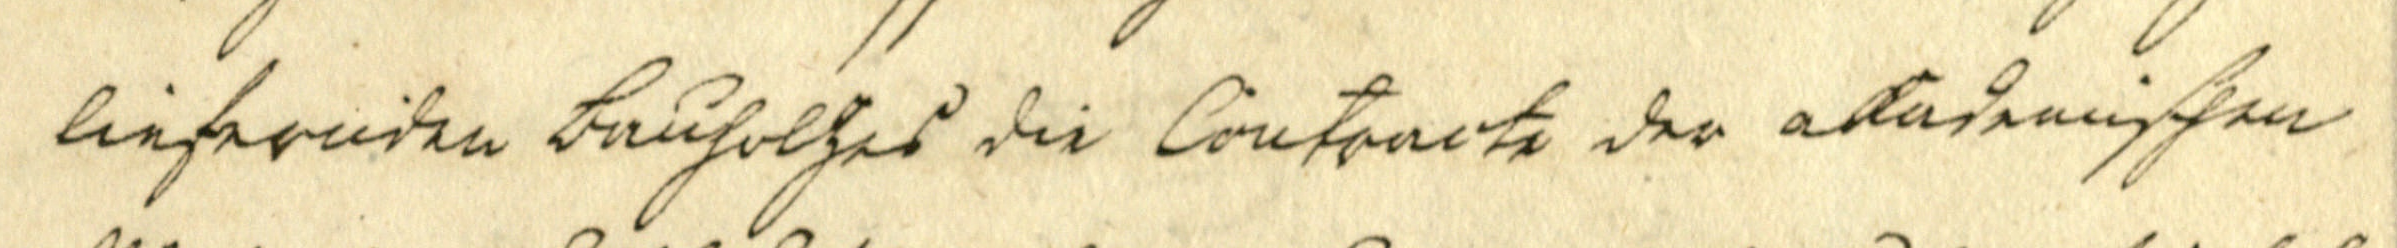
liefernden Bauholzes die Contracte der akademischen
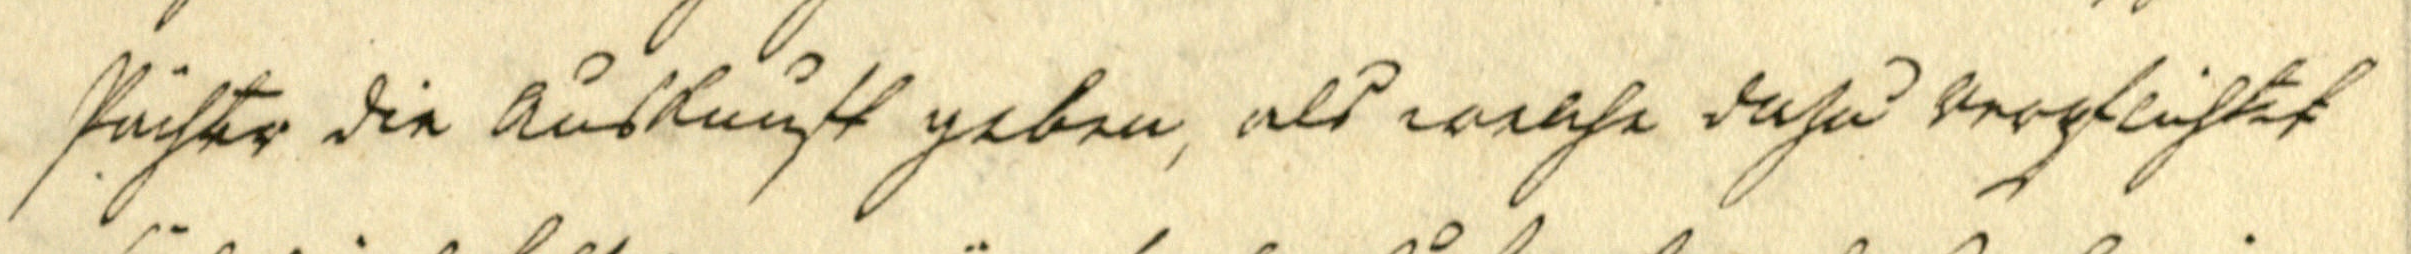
Pächter die Auskunft geben, als welche dazu verpflichtet
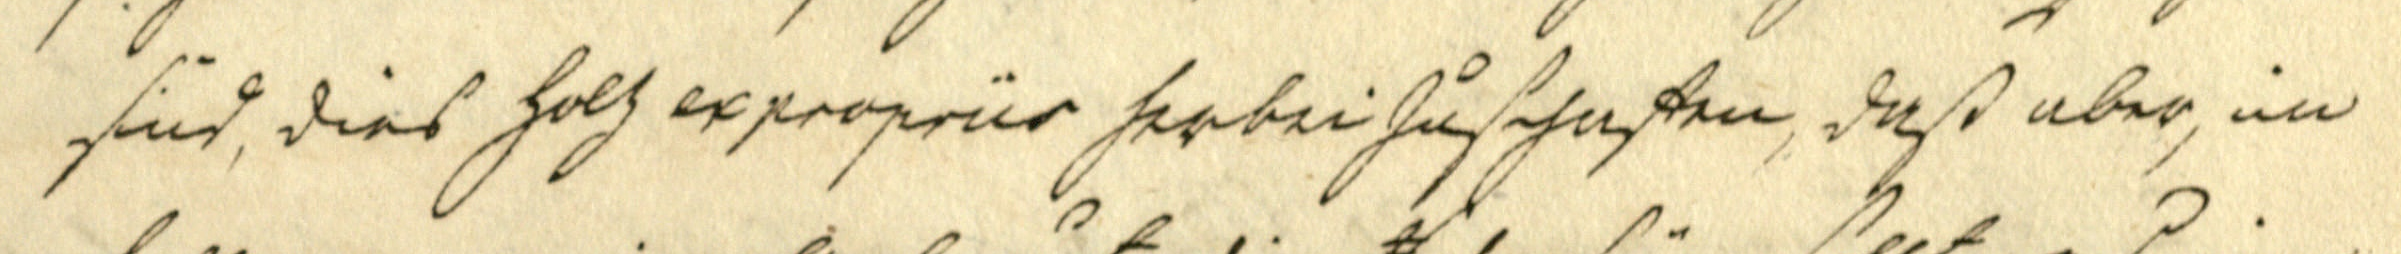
sind, dies Holz expropriis herbei zuschaffen, daß aber, im
